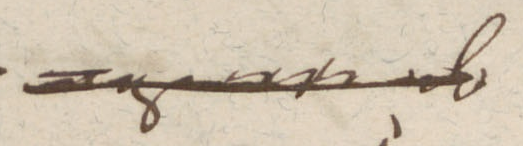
unfreien Willensäusserung.
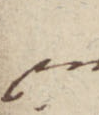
einer
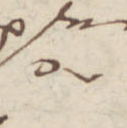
dienenden
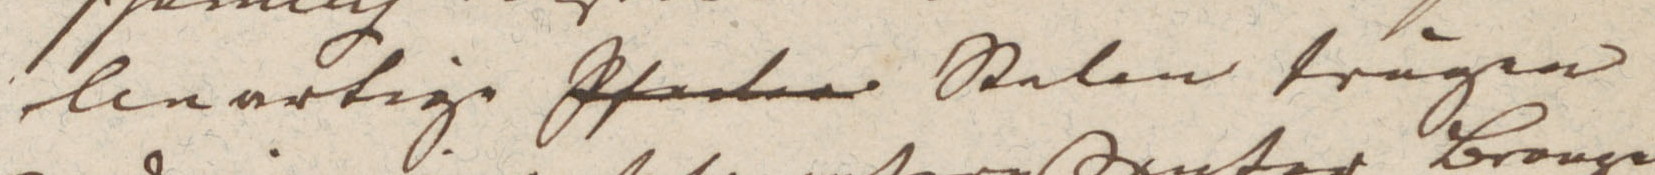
lenartige Pfeiler Stelen trugen
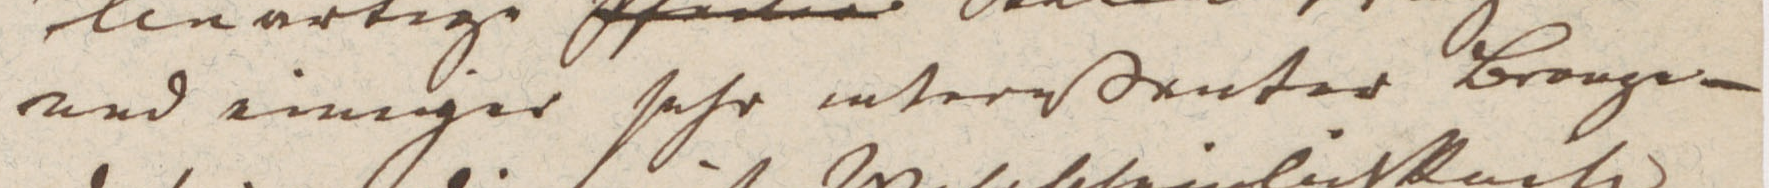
und einiger sehr interessanter Bronze-
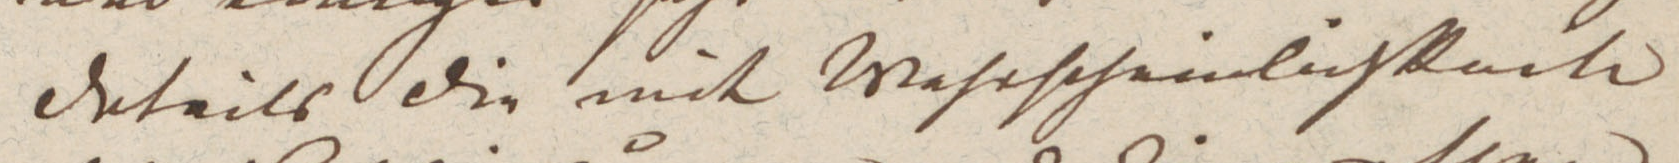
details die mit Wahrscheinlichkeit
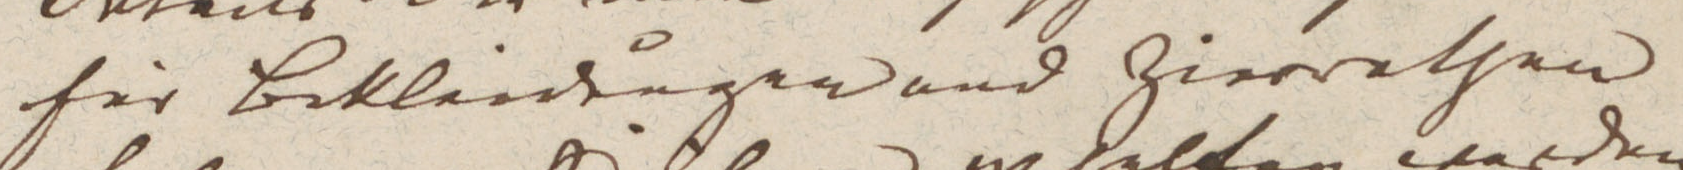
für Bekleidungen und Zierrathen
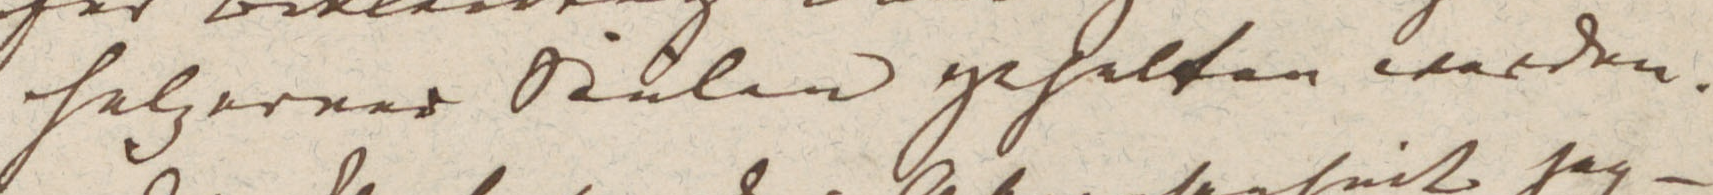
holzerner Säulen gehalten werden.
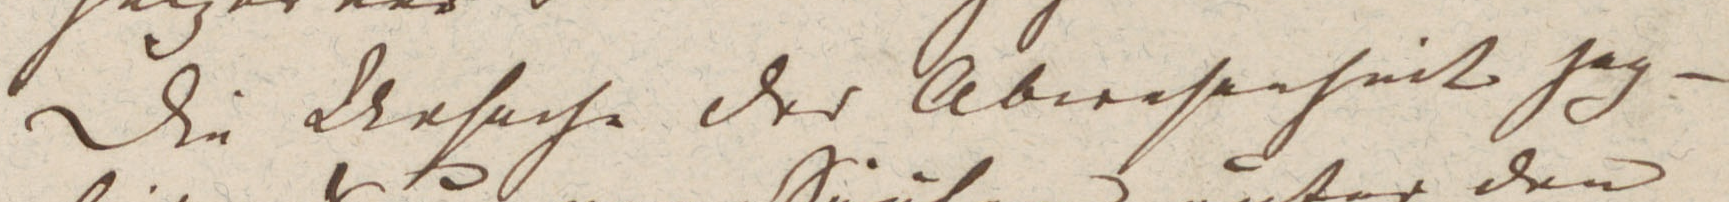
Die Ursache der Abwesenheit jeg-
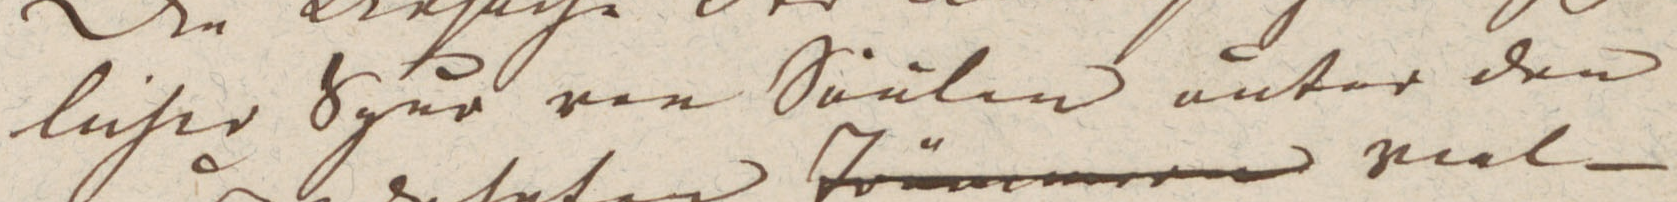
licher Spur von Säulen unter den
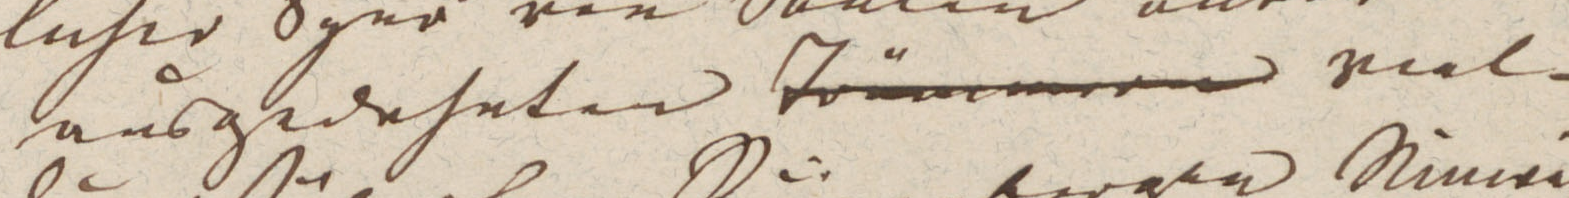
ausgedehnten Trümmern viel-
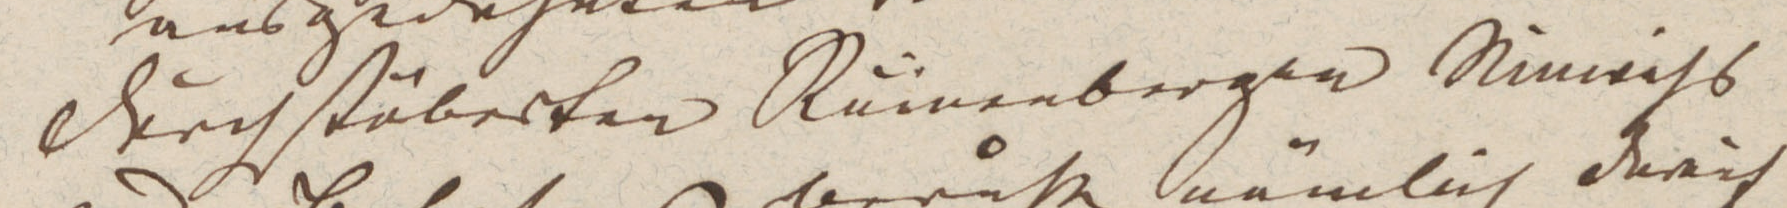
durchstöberten Ruinenbergen Ninivehs
